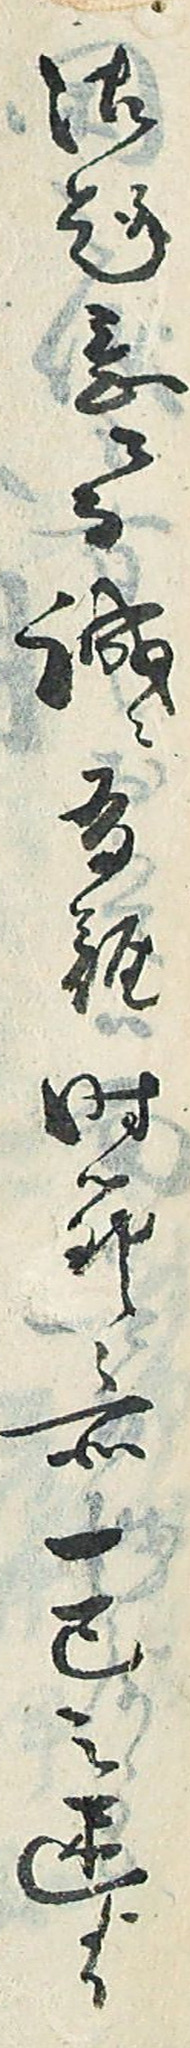御趣意に而誠に有難時節候所一己之迷より
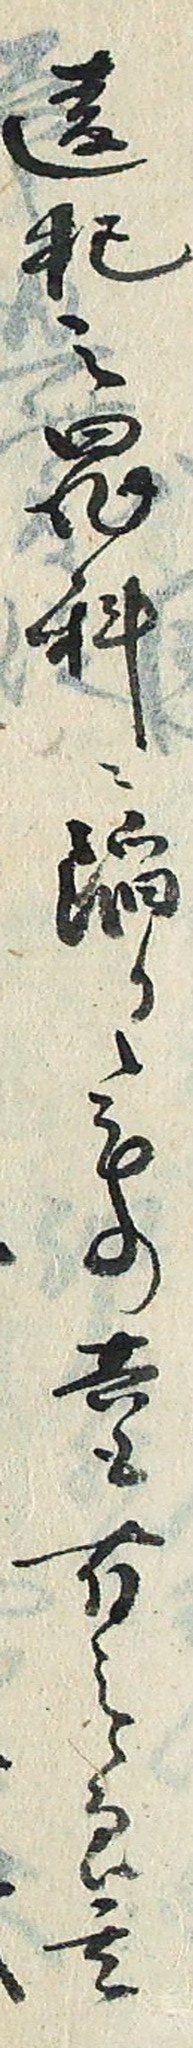違犯之罪科に陥り候もの共も有之候而は其
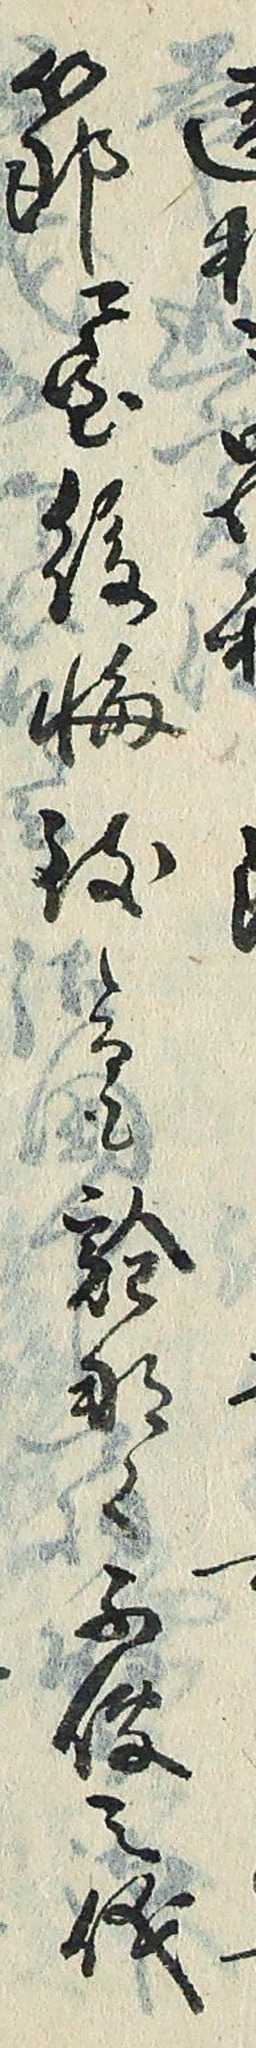節に至後悔致候而も詮なく不便之儀
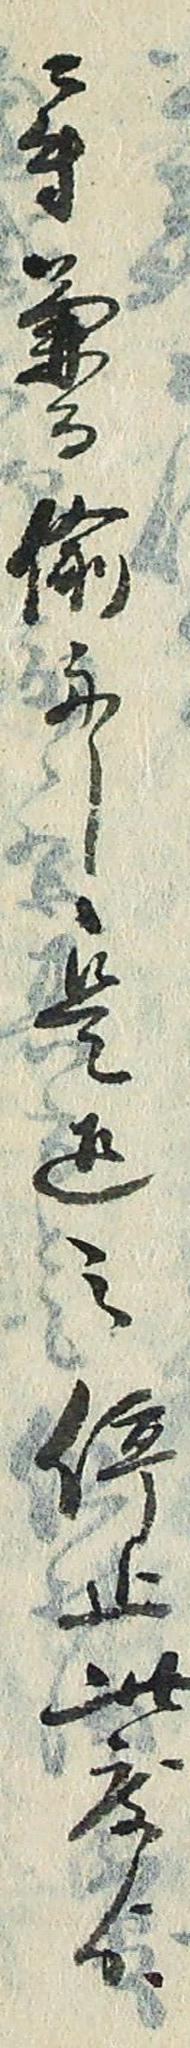に付兼而偸にし候是迄之停止此度ゟ
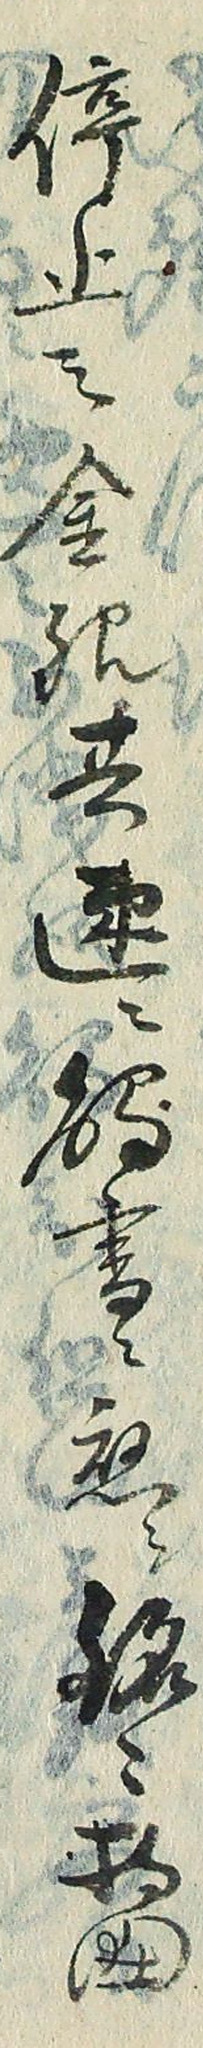停止之金銀共速に触書に応し銘々持囲
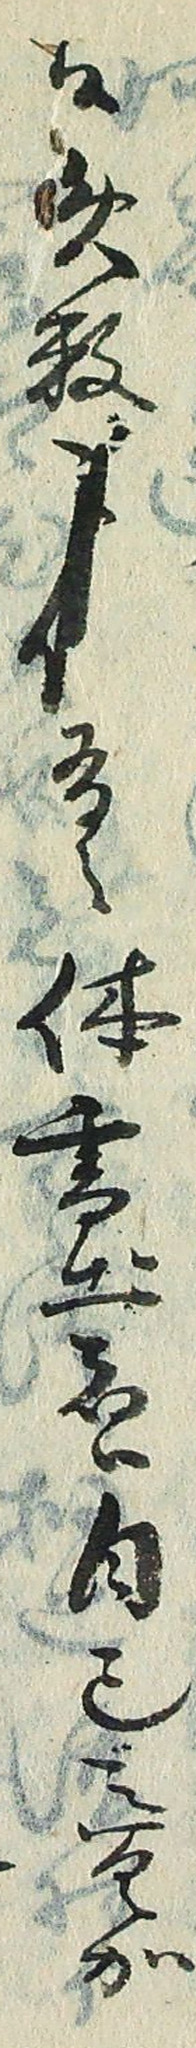候員数有之体書出者は自己之冥加
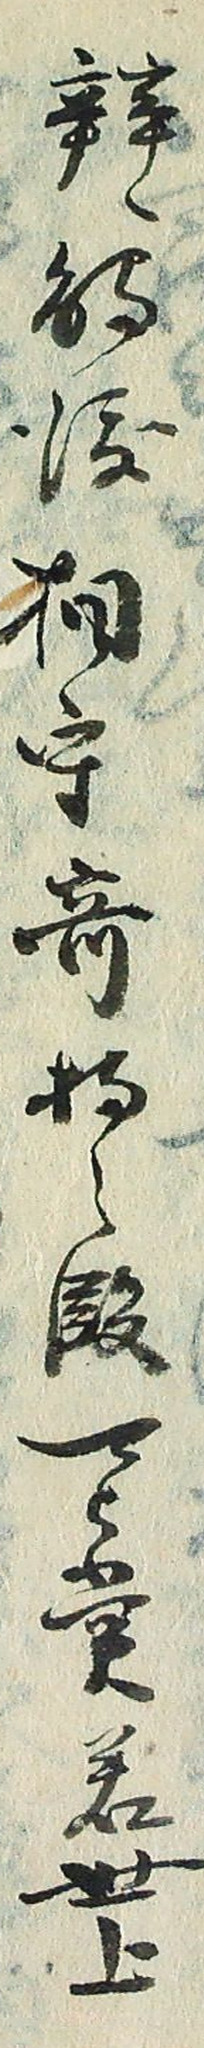弁候触渡相守奇特之段可被賞若世上
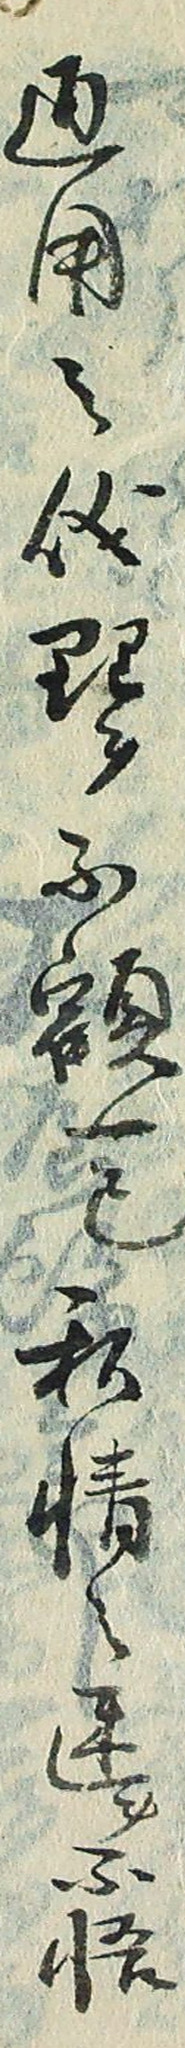通用之儀理を不顧一己私情之迷を不悟
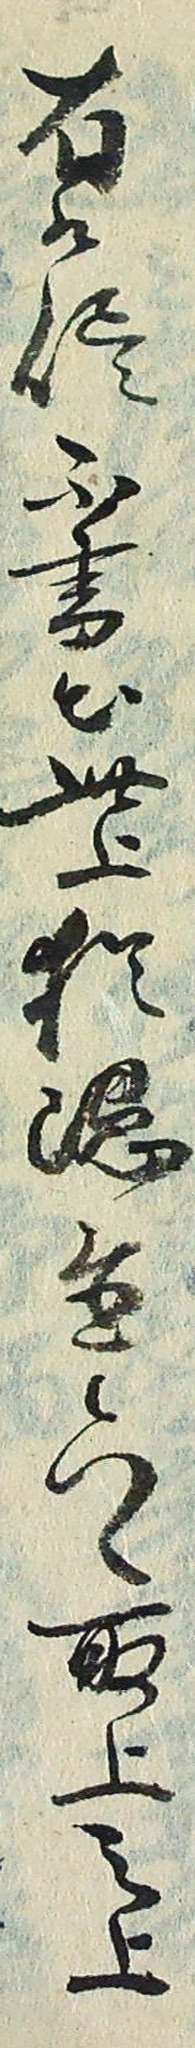有候儘不書出世上猶隠置候はゝ取上之上
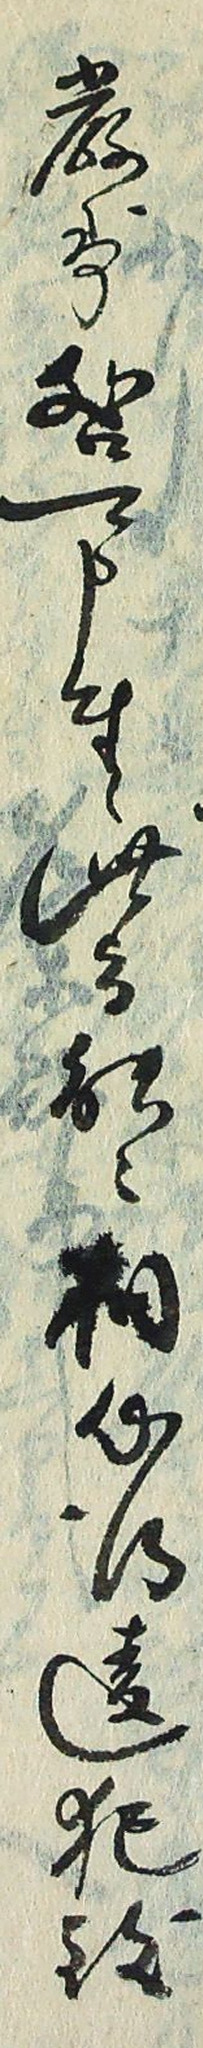厳布咎可申付候此旨能々相心得違犯致
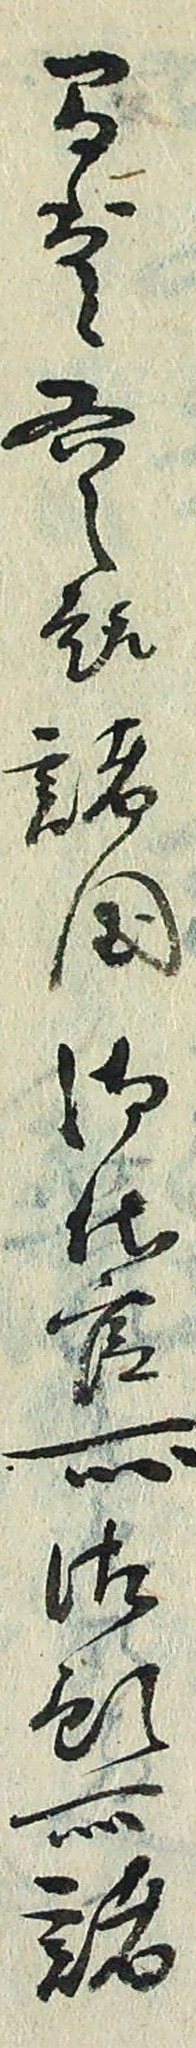間布候右之趣諸国御代官所御預所諸
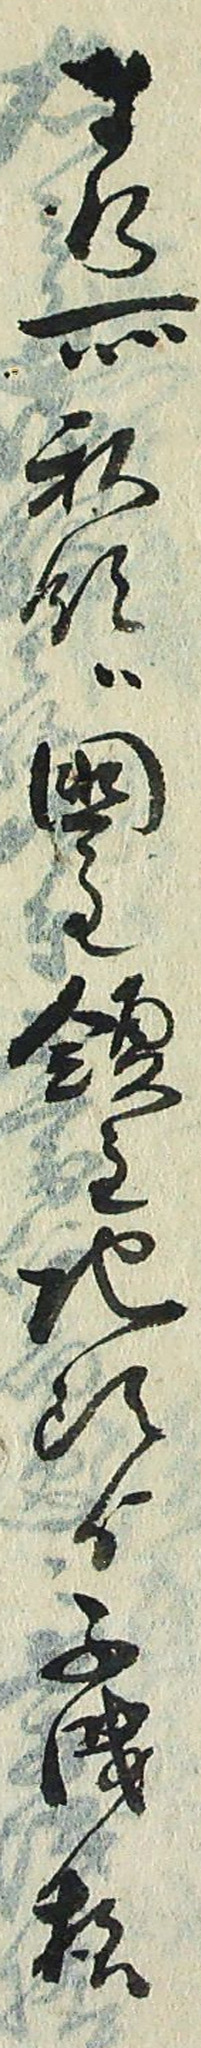奉行所私領は国主領主地頭ゟ不洩様
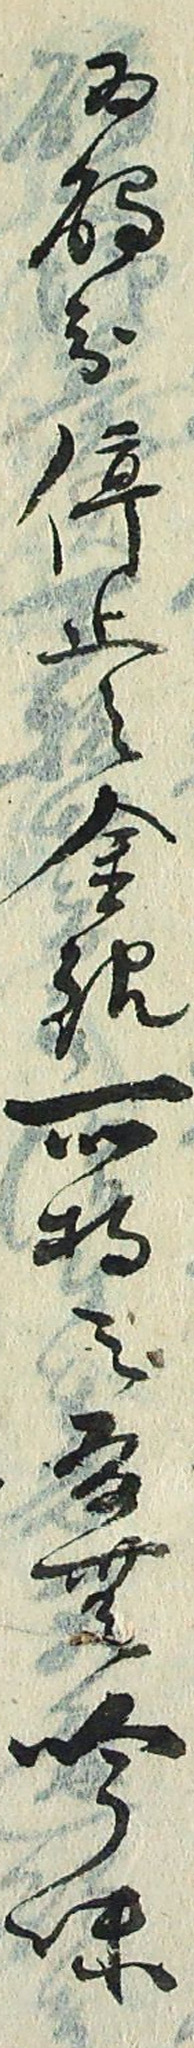為触知停止之金銀所持之有無吟味
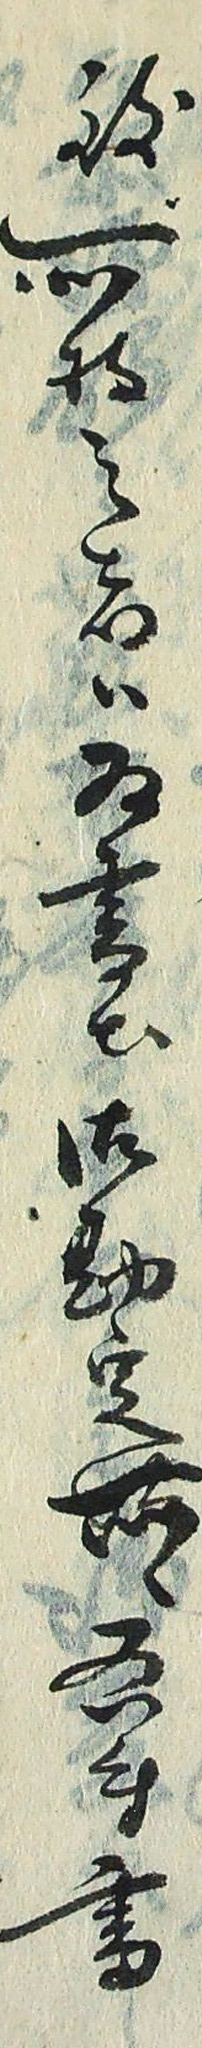致所持之者は為書出御勘定所へ右付書
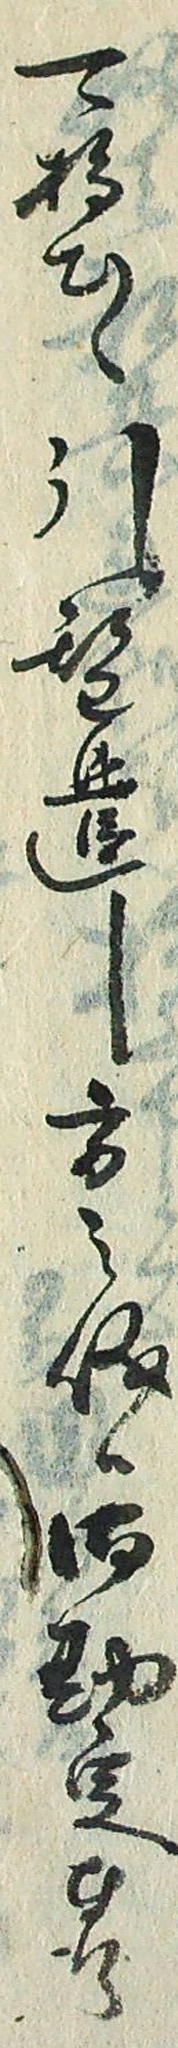可指出候引替遣し方之儀は御勘定奉行
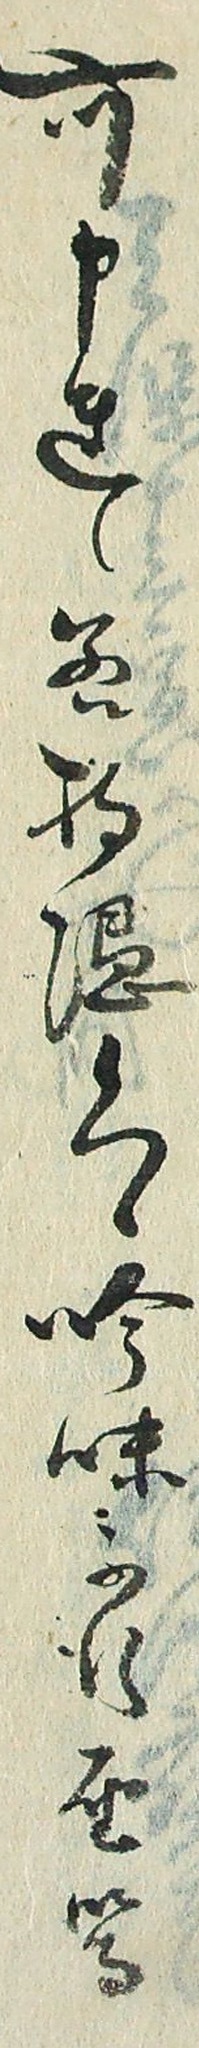所可申達候右持隠候はゝ吟味不行届等
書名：諸御用御□受書控
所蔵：鳴門教育大学 Naruto University of Education
